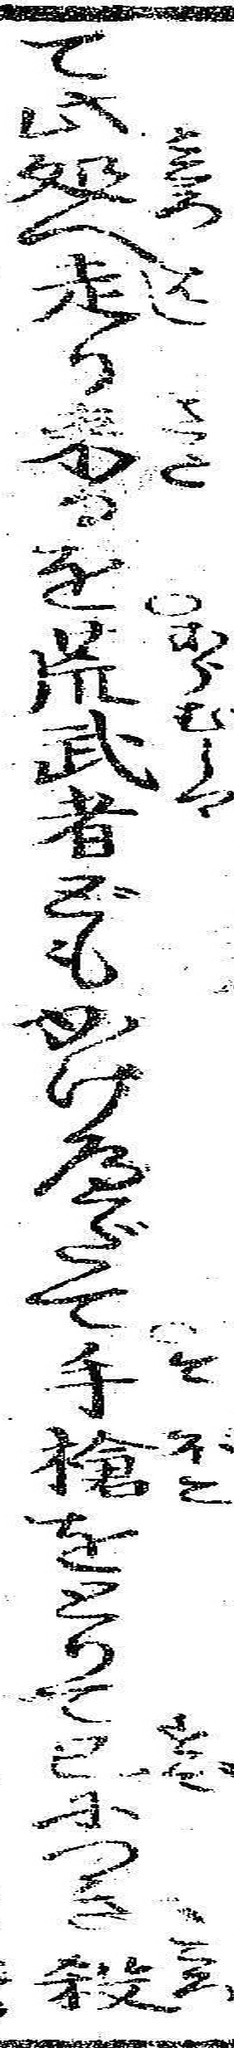て此処へ走り来るを。荒武者どもかけへだて。手槍をとりて已につき殺
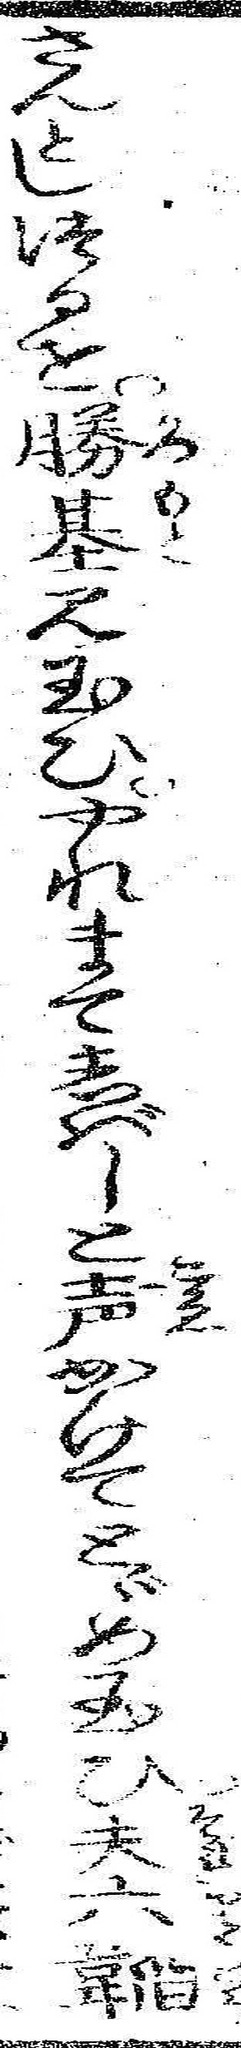さんとしつるを。勝基見玉ひ。やれまてしばしと声かけてとゞめ玉ひ。夫六韜
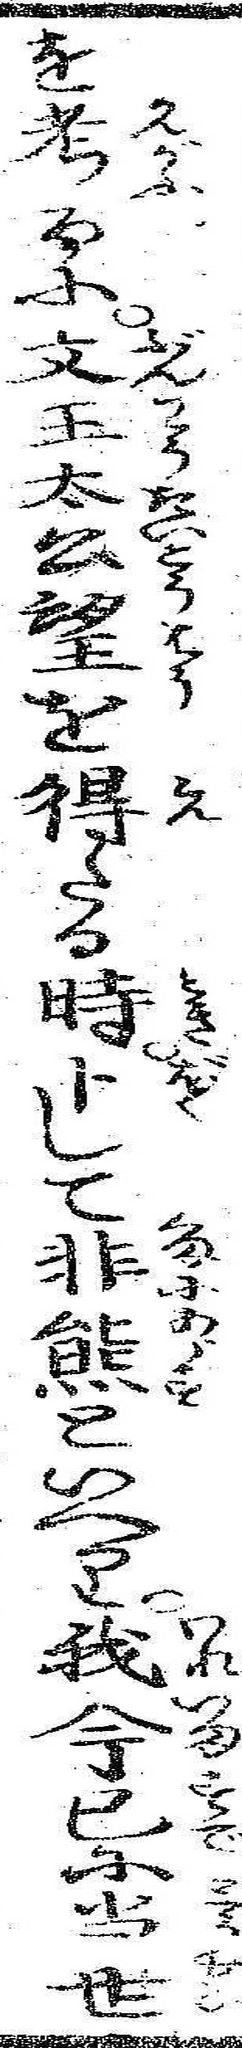を考るに。文王太公望を得たる時。卜して非熊といへり。我今已に当世
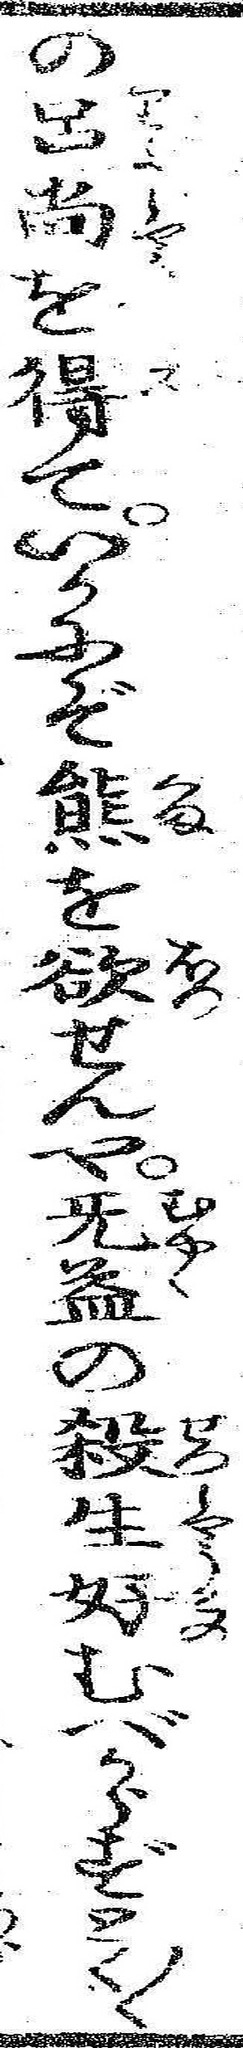の呂尚を得て。いかにぞ熊を欲せんや。無益の殺生好むべからずとく〳〵
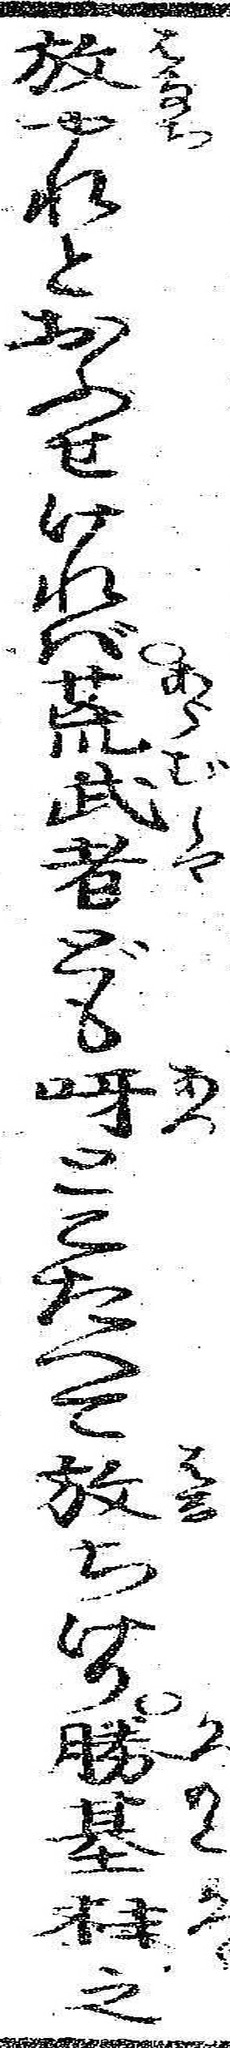放やれとおふせければ。荒武者ども呀とこたへて放ちけり。勝基桂之
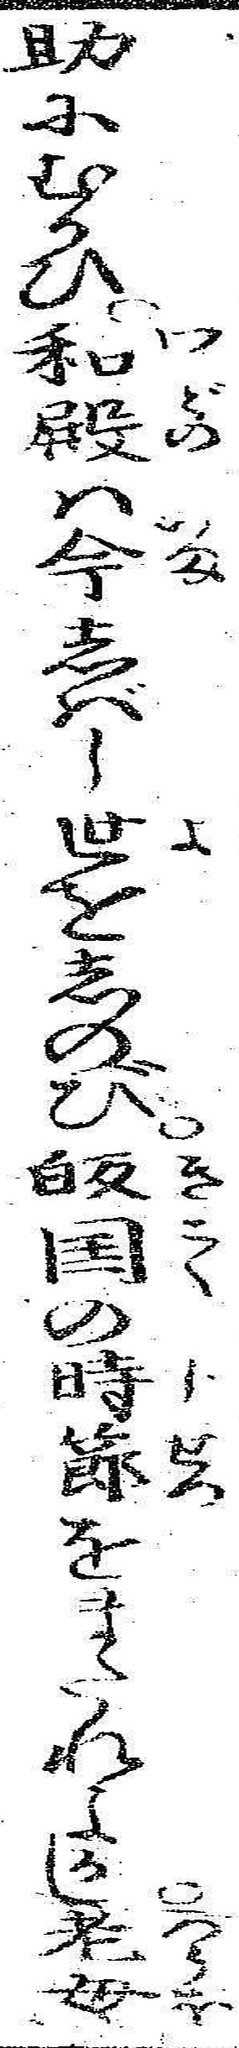助にむかひ。和殿は今しばし世をしのび。帰国の時節をまたれよかし。老母
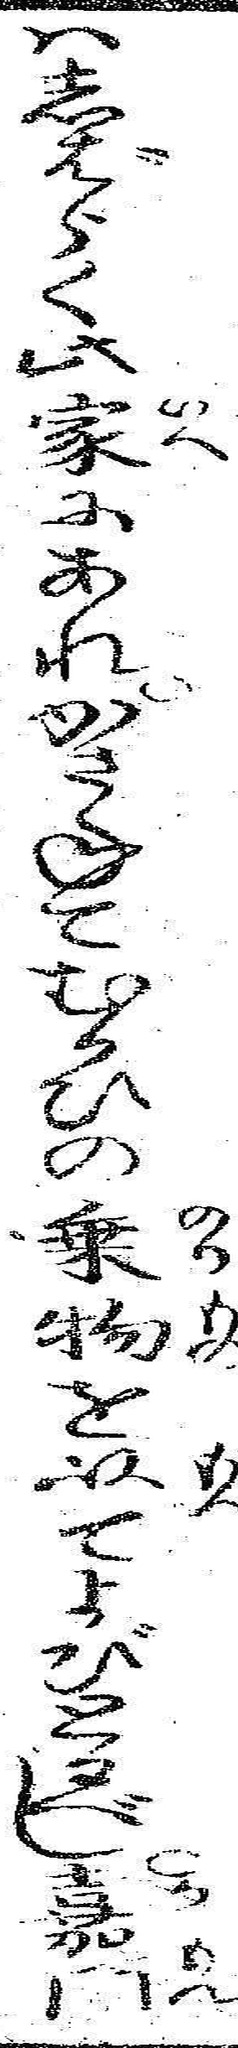はしばらく此家にあれ。かさねてむかひの乗物を以てよびとるしべ。嘉門
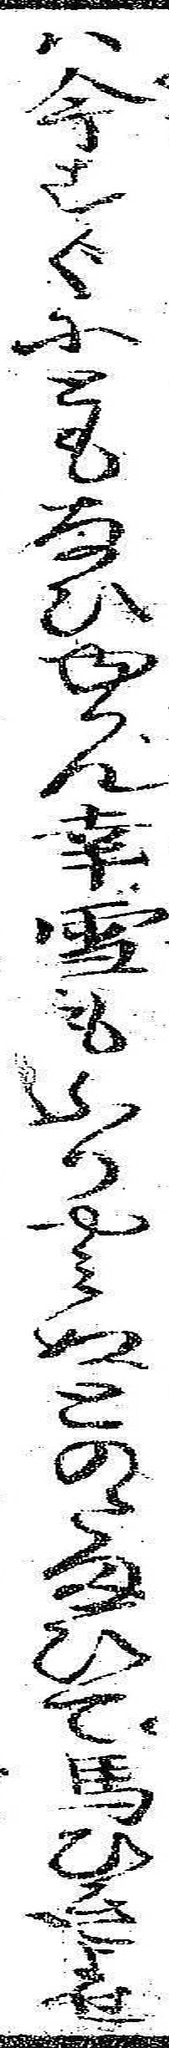は今すぐにともなひゆかん。幸雪もふりやみぬとのたまひて。馬ひきよせ
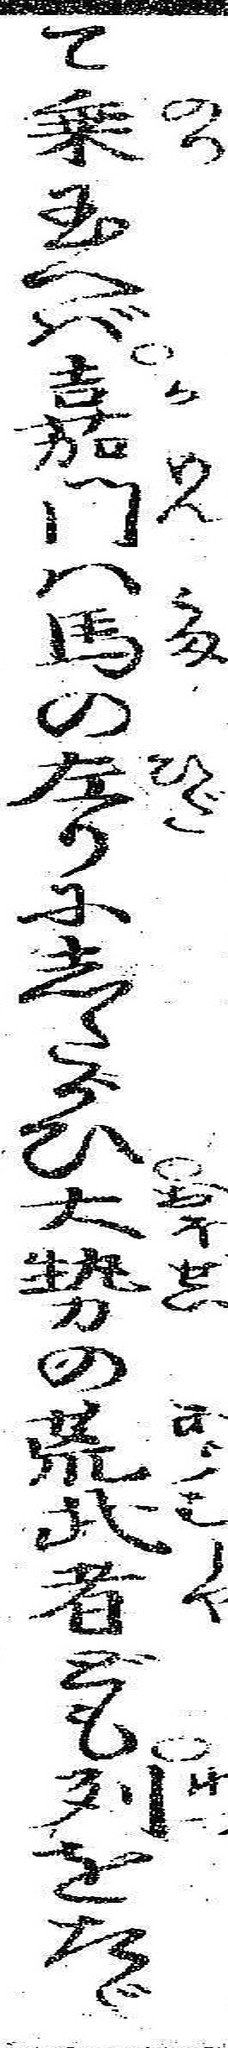て乗玉へば。嘉門は馬の左りにしたがひ。大勢の荒武者ども。列をたゞ

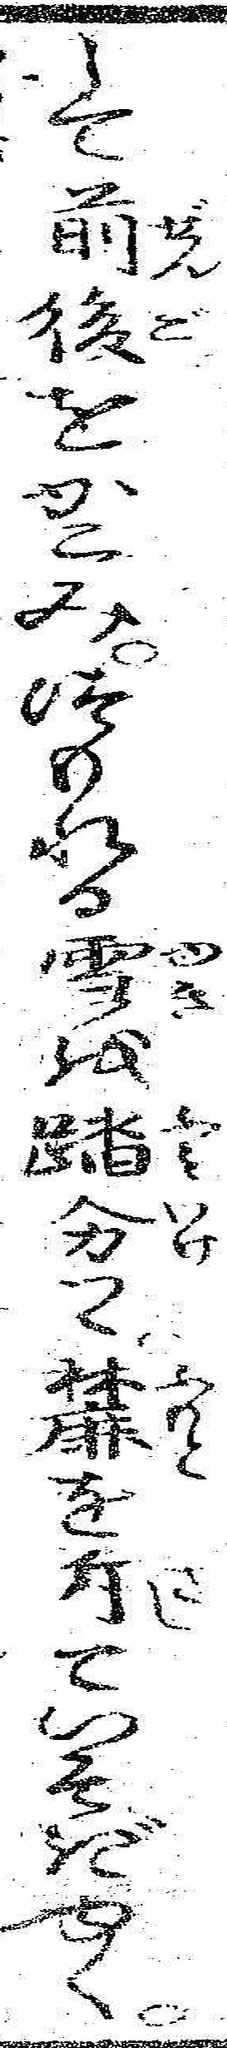して前後をかこみ。つもれる雪を踏分つゝ。麓を斥ていそぎゆく。
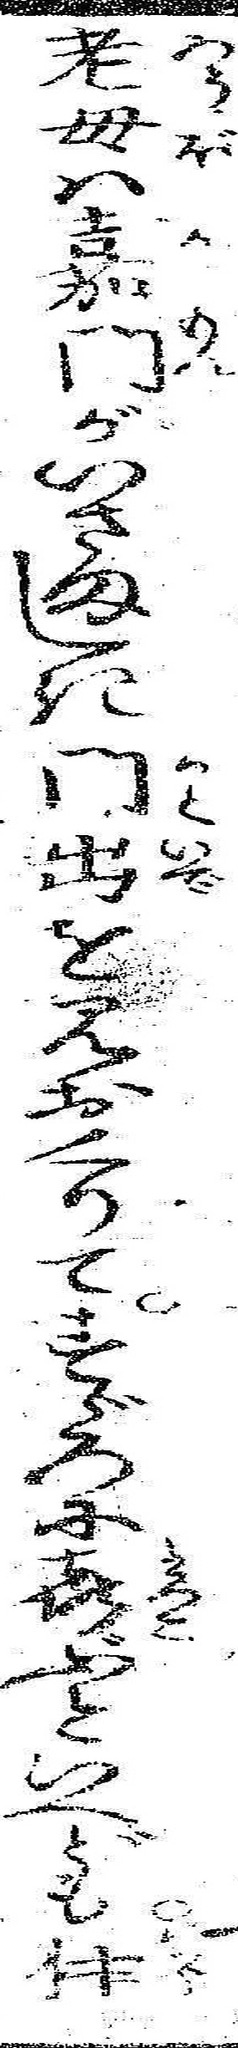老母は嘉門がいさましき門出を見おくりて。すゞろに喜ぶといへども。桂
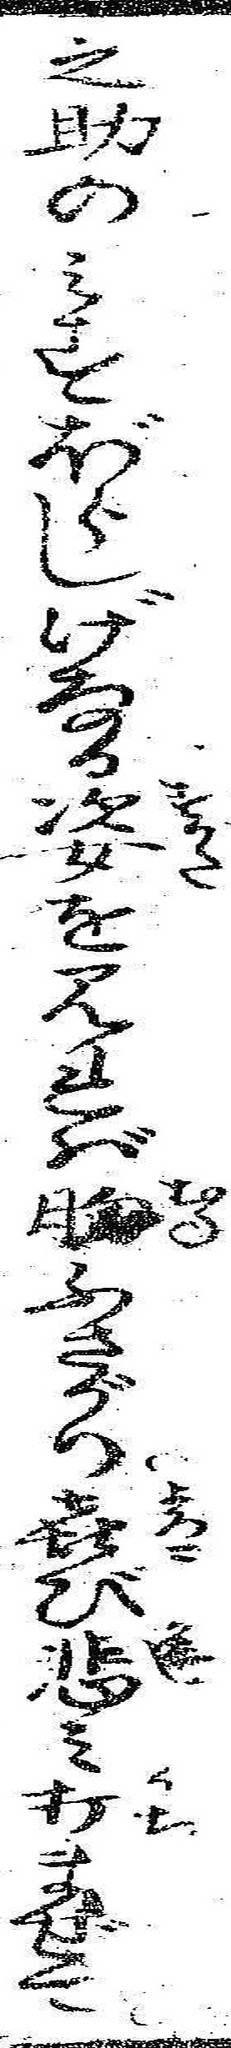之助のみすぼらしげなる姿を見れば胸ふさがり。喜び悲み打まぜて。
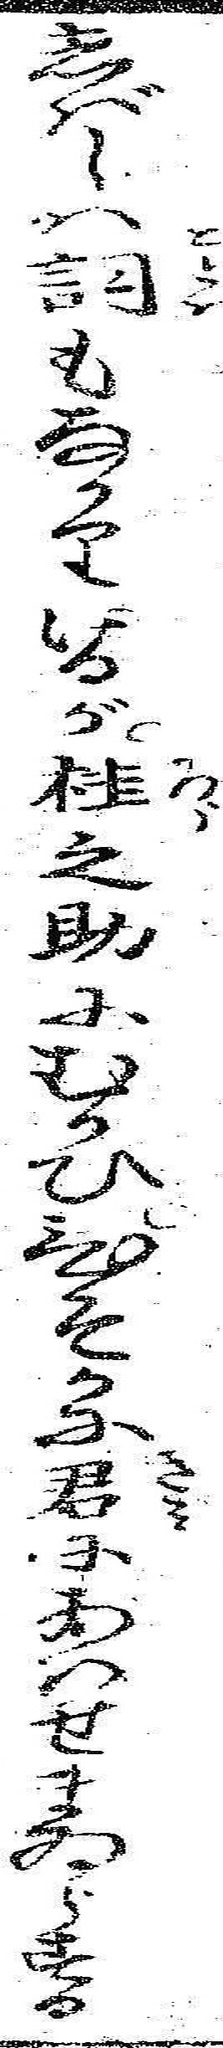しばしは詞もなかりけるが。桂之助にむかひ。ひそかに君にあはせまゐらする
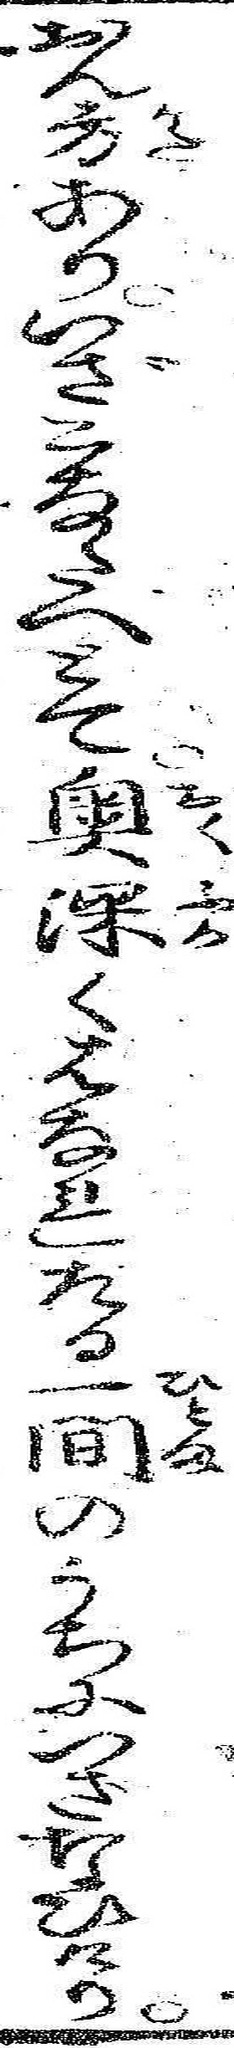おん方あり。いざこなたへとて。奥深くはなれたる一間のうちにいざなひけり。
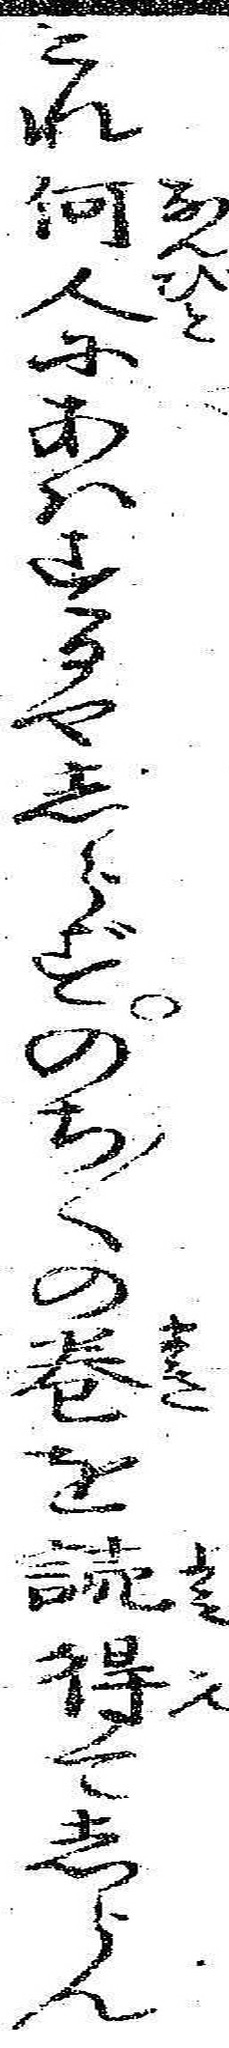これ何人にあはするやしらず。のち〳〵の巻を読得てしらん
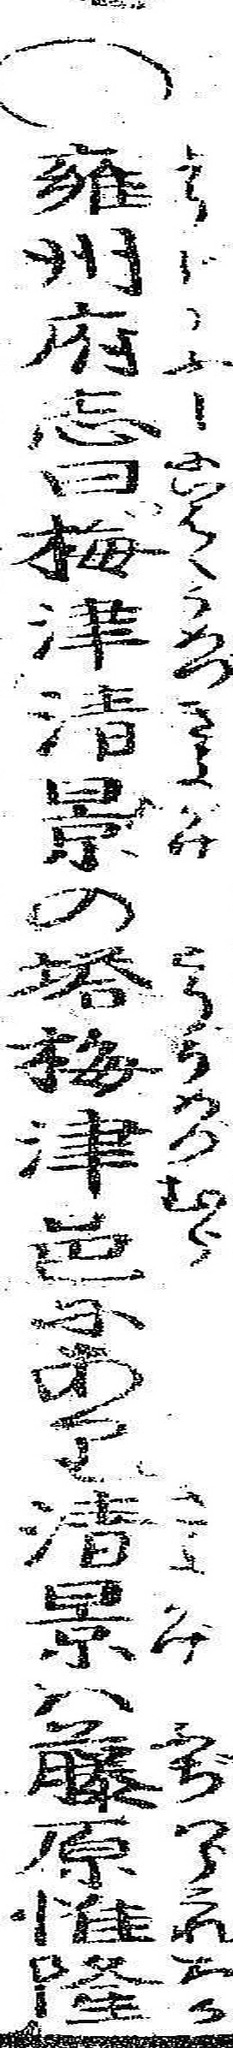○雍州府志曰。梅津清景の塔梅津邑にあり。清景は藤原惟隆
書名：昔話稲妻表紙
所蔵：国文学研究資料館
